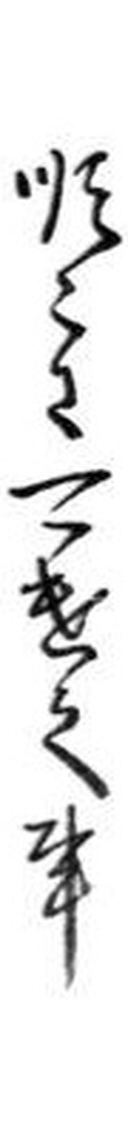順々に可遣之事
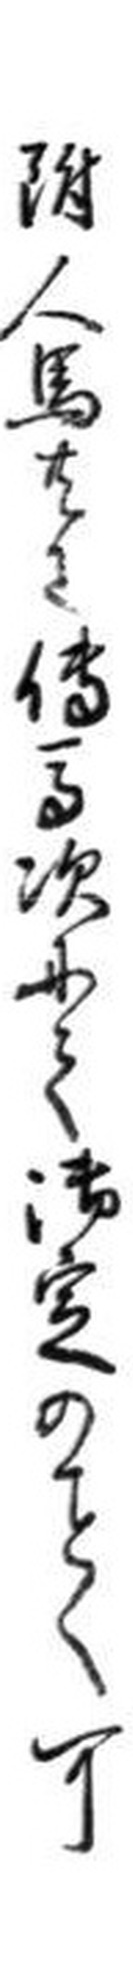附人馬共に伝馬次にて御定のことく可
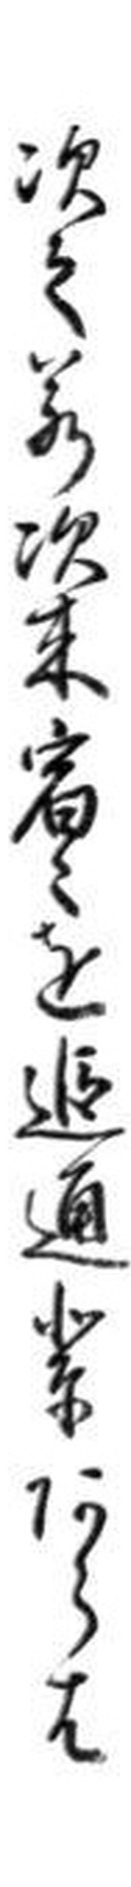次之若次来宿々を追通輩あらは
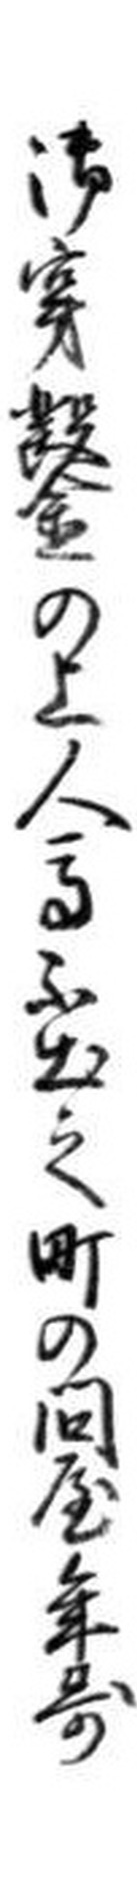御穿鑿の上人馬不出之町の問屋年寄
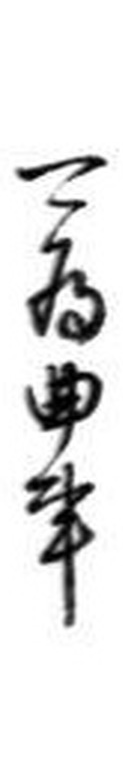可為曲事
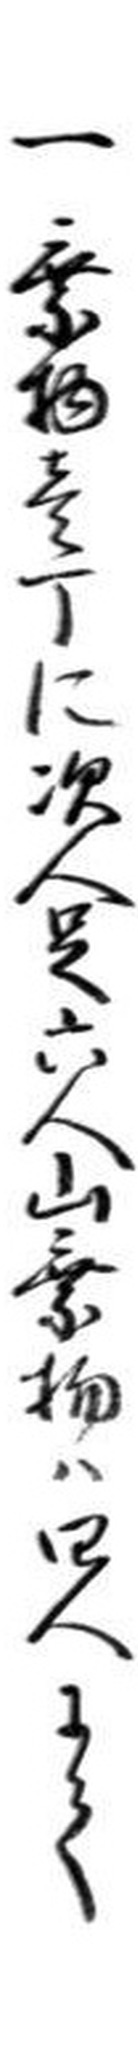一乗物壱丁に次人足六人山乗物ハ四人にて
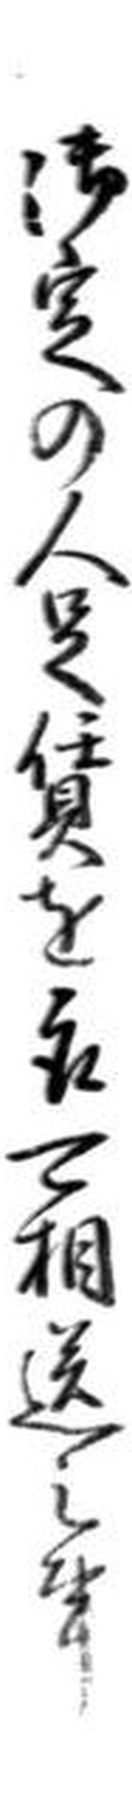御定の人足賃を取可相送之事
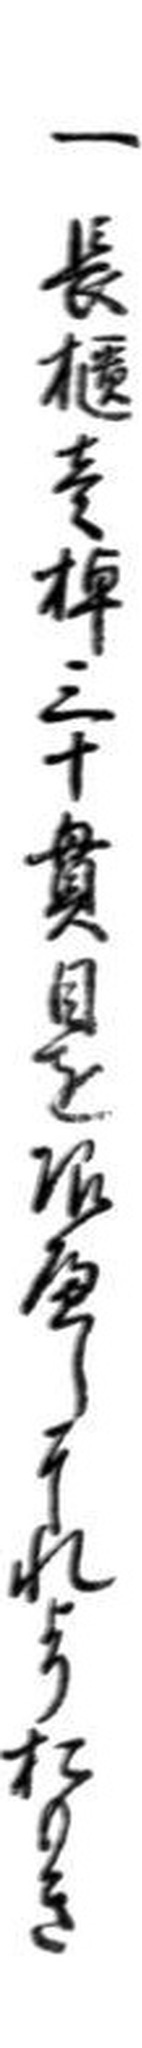一長櫃壱棹三十貫目を限へしそれよりおもき
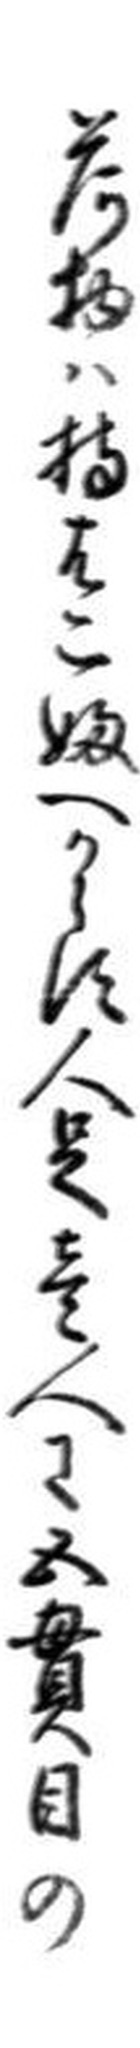荷物ハ持はこふへからす人足壱人に五貫目の
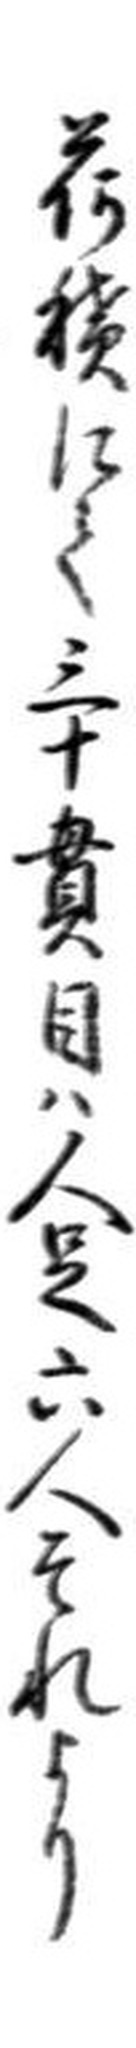荷積にて三十貫目ハ人足六人それより
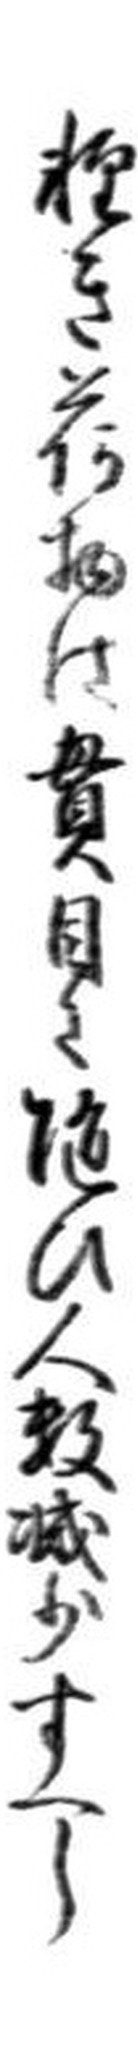軽き荷物は貫目に随ひ人数減少すへし
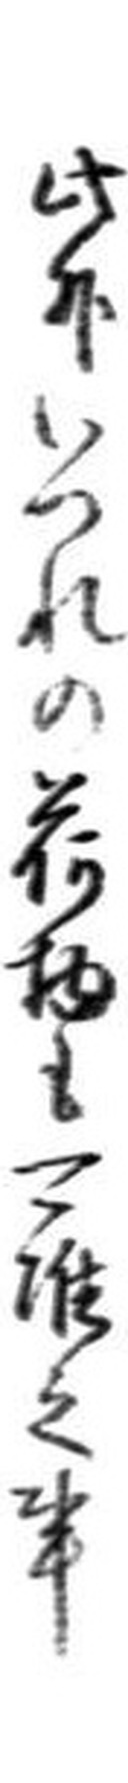此外いつれの荷物も可准之事
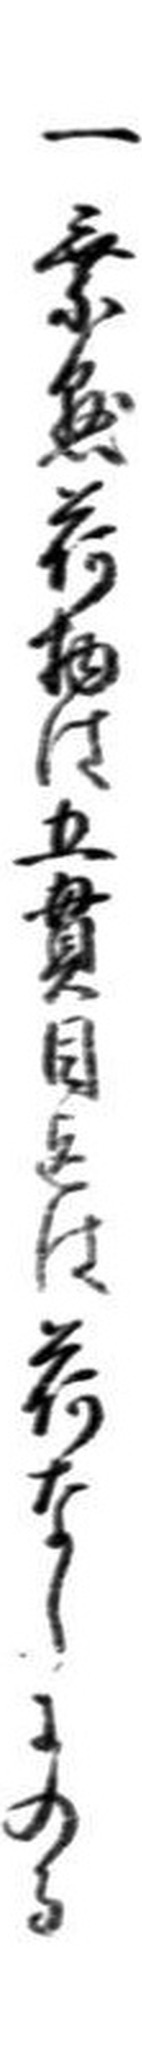一乗懸荷物は五貫目迄は荷なしにのる
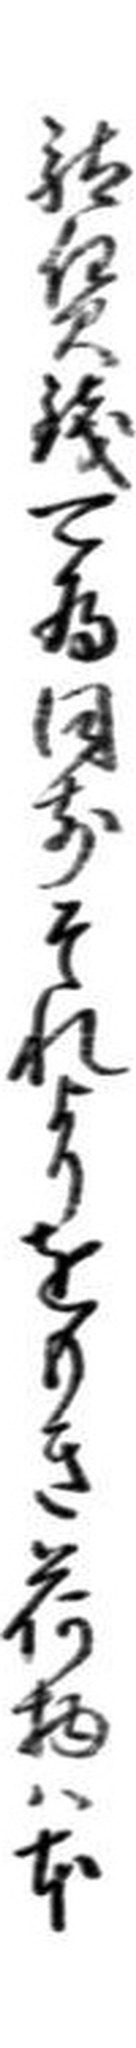駄賃銭可為同前それよりおもき荷物ハ本
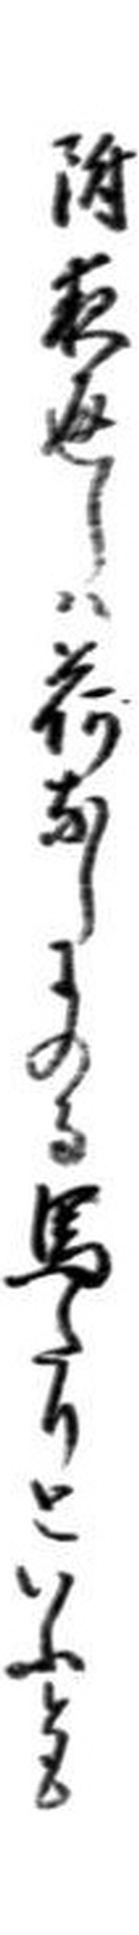附夜返しハ荷なしにのる馬たりといふとも

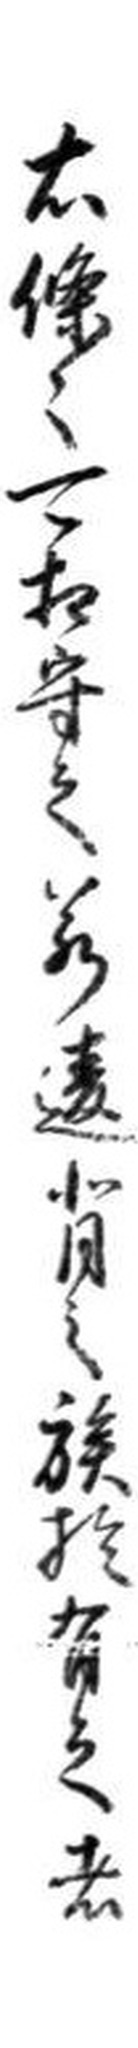右条々可相守之若違背之族有之者
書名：家譜 七 光通公 従寛文四年到同九年
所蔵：福井県文書館 Fukui Prefectural Archives
